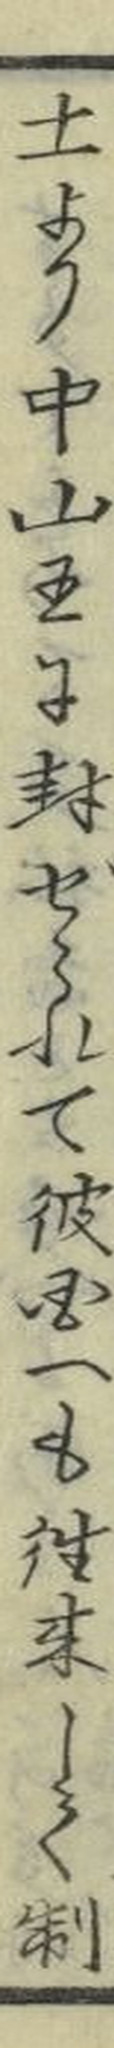土より中山王に封ぜられて、彼国へも往来して、制
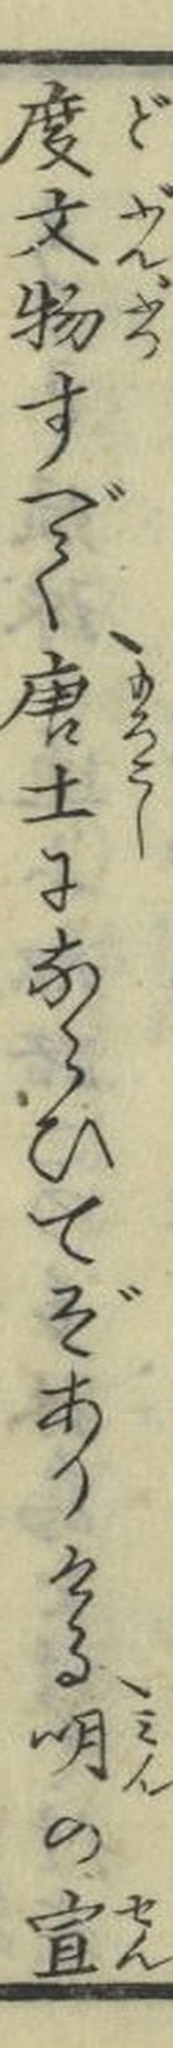度文物すべて、唐土にならひてぞありける、明の宣
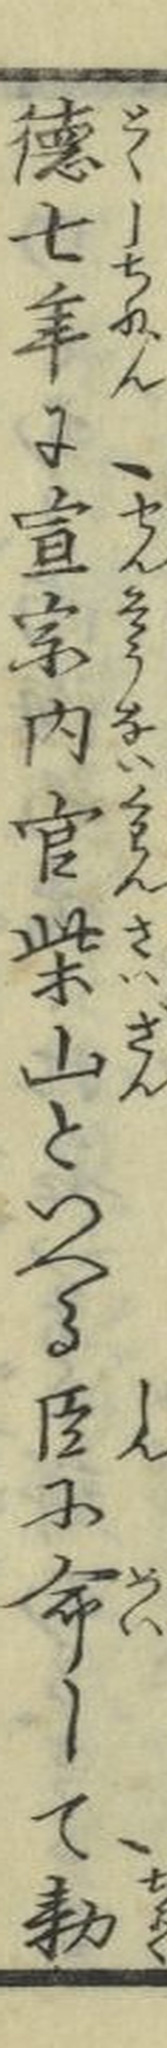徳七年に、宣宗内官紫山といへる臣に命して、勅
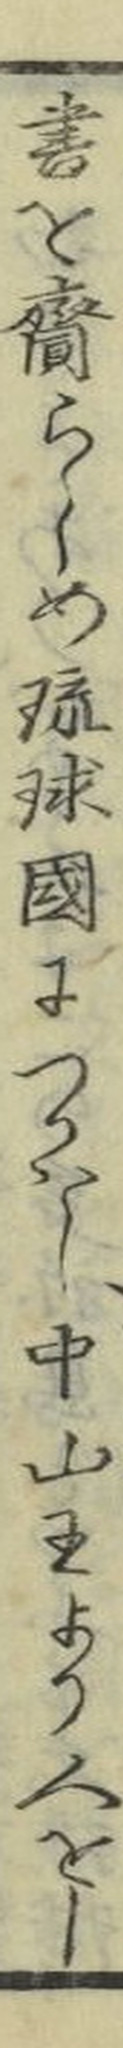書を齎らしめ琉球国につかはし、中山王より人をし
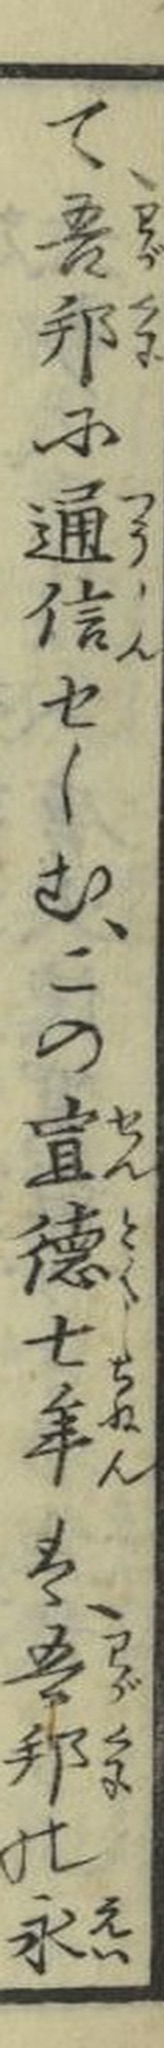て、吾邦に通信せしむ、この宣徳七年は、吾邦の永
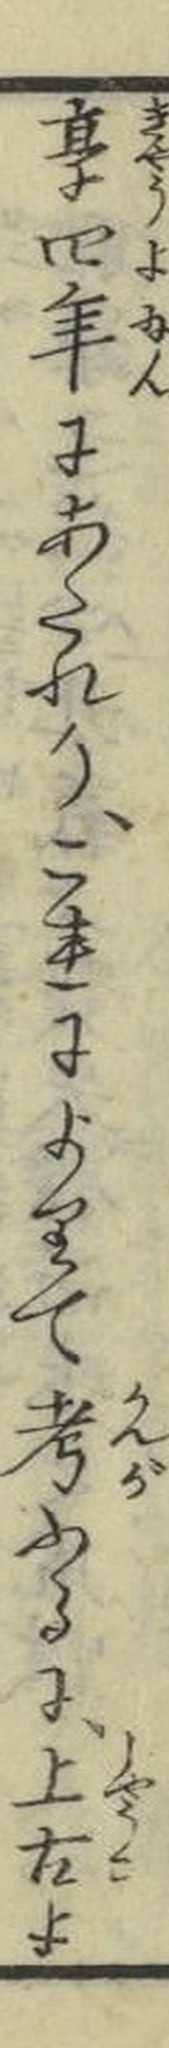享四年にあたれり、これによりて考ふるに、上古よ
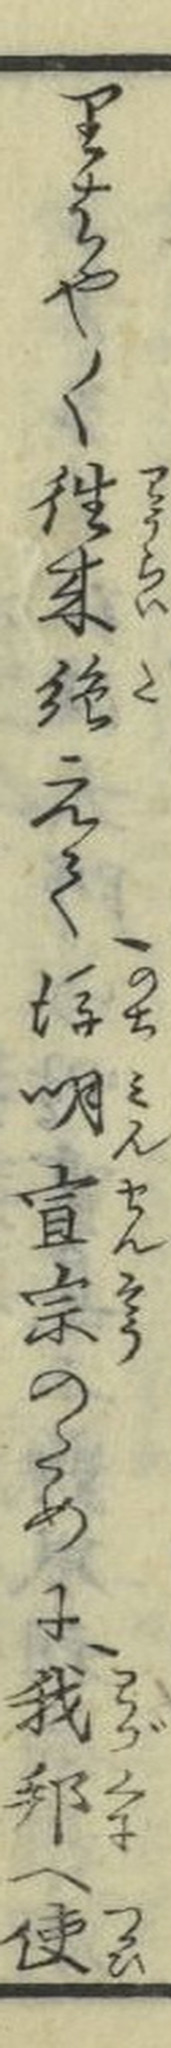りはやく往来絶えて、後明宣宗のために、我邦へ使
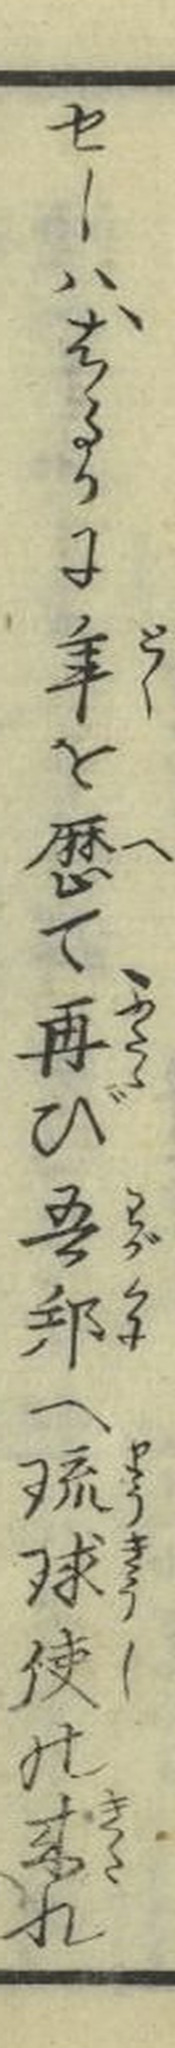せしは、はるかに年を歴て、再び吾邦へ琉球使の来れ
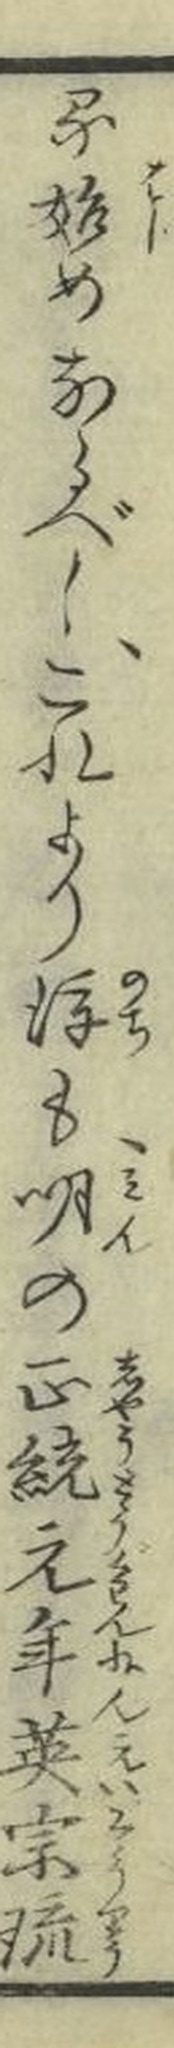る始めなるべし、これより後も、明の正統元年英宗琉
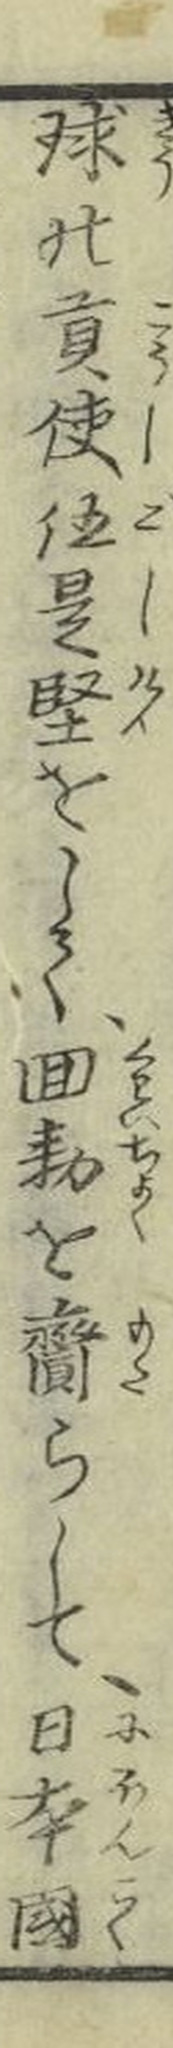球の貢使伍是堅をして、回勅を齎らして、日本国

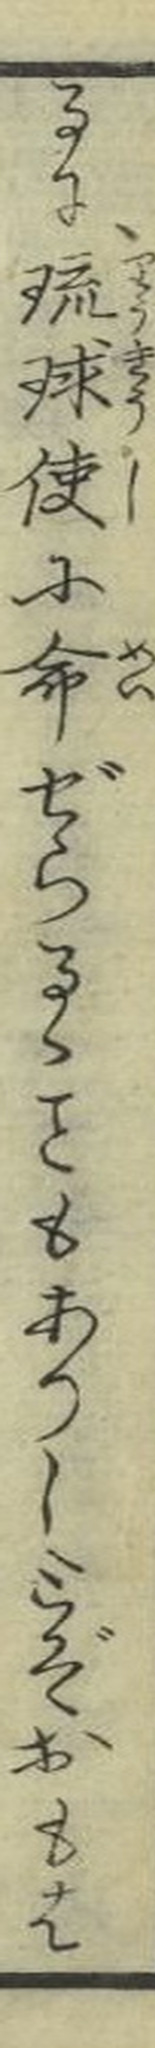るに、琉球使に命ぜらるゝこともありしとぞおもは
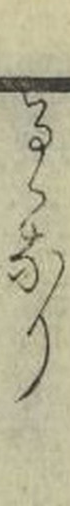るゝなり
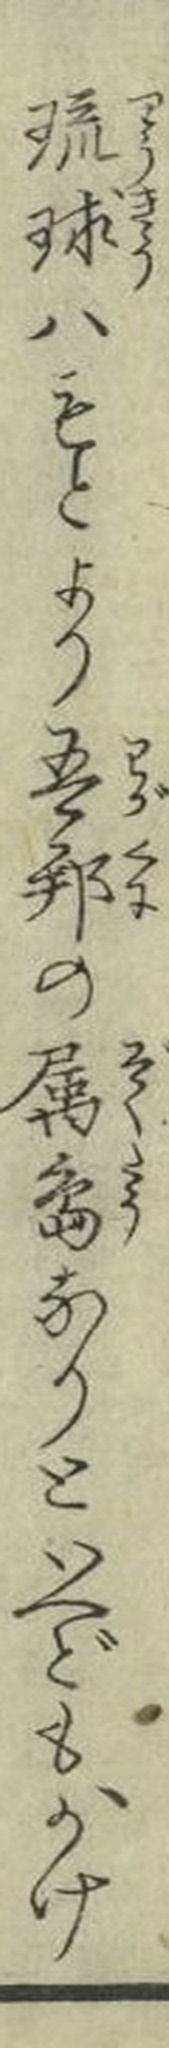琉球はもとより吾邦の属島なりといへども、かけ
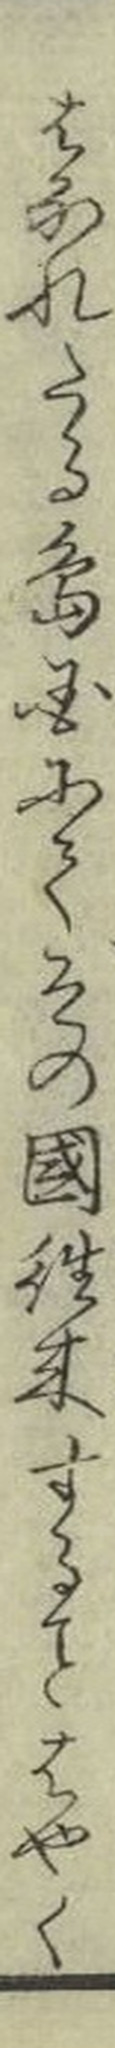はなれたる島国にて、その国往来することはやく
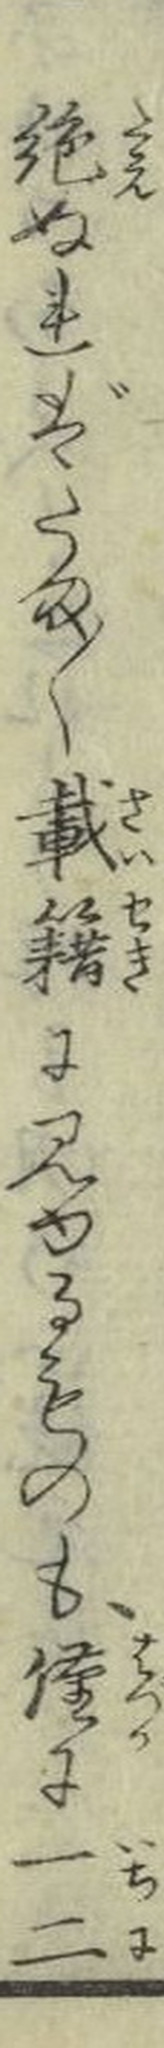絶ぬればたま〳〵載籍に見ゆるものも、僅に一二
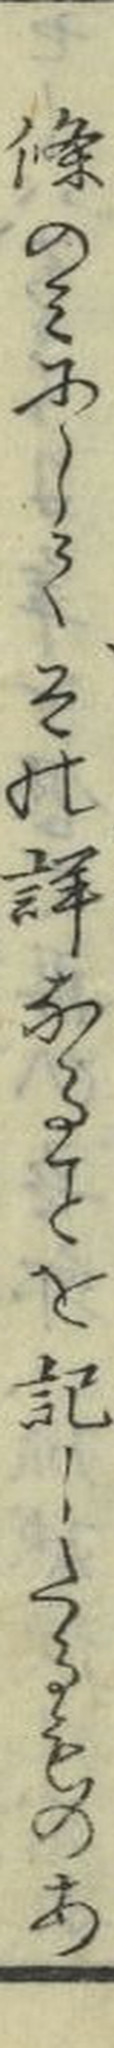条のみにして、その詳なることを記したるものあ
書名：琉球入貢紀略
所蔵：University of the Ryukyus Library
